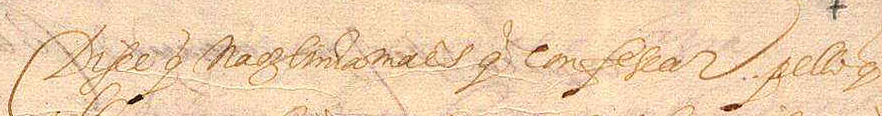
Disse q̄ naõ tinha maes q̄ confessar. pello q̄
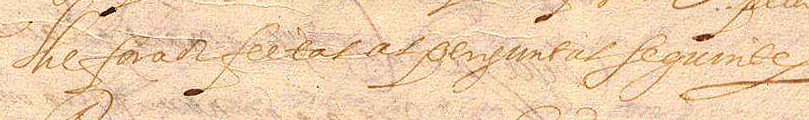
lhe foraõ feitas as perguntas seguintes
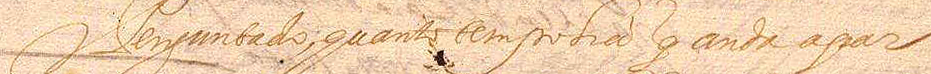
item Perguntado, quanto tempo hà q̄ anda apar
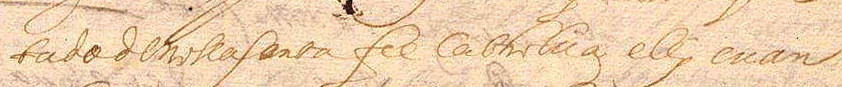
tado de nossa santa fee catholica e ley euan
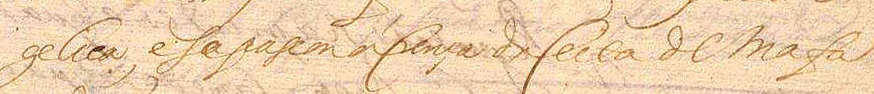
gelica, e se passou á Crença da Ceita de mafa
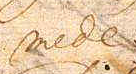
mede?
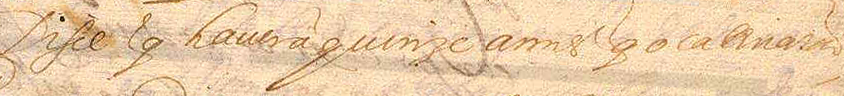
Disse q̄ hauerà quinze annos q̄ o catiuaraõ
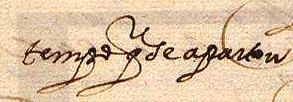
tempo q̄ se apartou
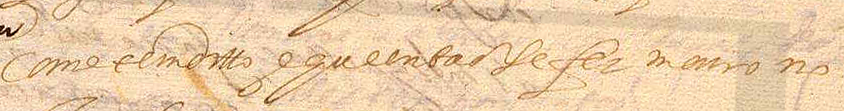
como tem ditto e que entaõ se fez mouro no
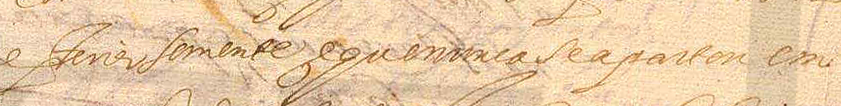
exterior somente, e que nunca se apartou em
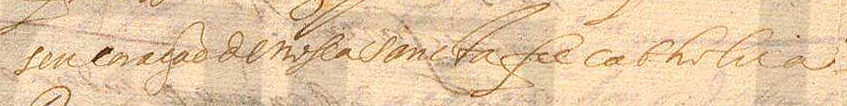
seu coraçaõ de nossa sancta fee catholica
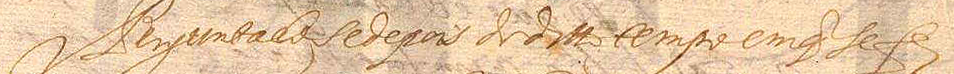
item Perguntado se depois do ditto tempo em q̄ se fez
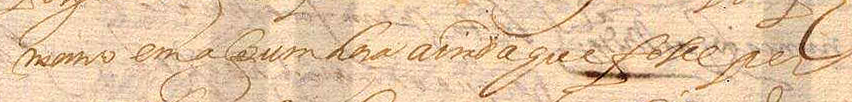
mouro em algum hora ainda que fosse per
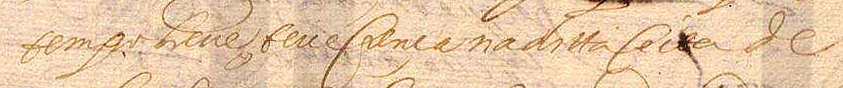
tempo breue teue Crença na ditta Ceita de
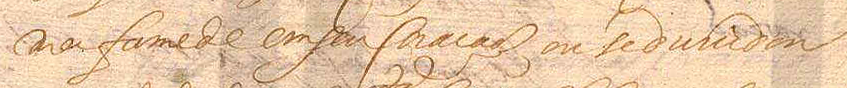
mafamede em seu Coraçaõ ou se duuidou
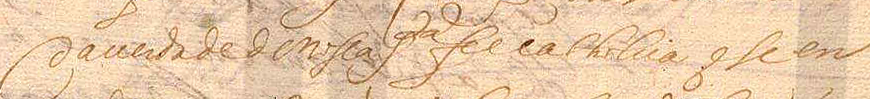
da uerdade de nossa sta fee catholica, e se en
